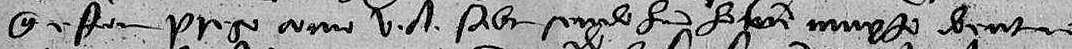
q̄ estou preso como v. A. sabe sendo hū homē muyto doentio
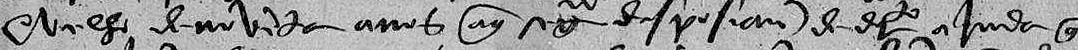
e velho de novēta anos a q̄ segdo disposiçaõm de drto aJnda q̄
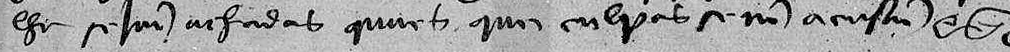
lhe seJaõ achadas quaesquer culpas se nō acusaõ e c̄ꝭ
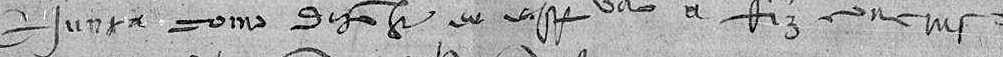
E Junta como dito he eu espivaõ a fiz concruso
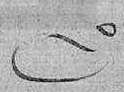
Co
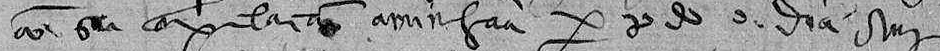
c̄o sua apelaçaõ amenhaā ꝑ todo o dia Anto
